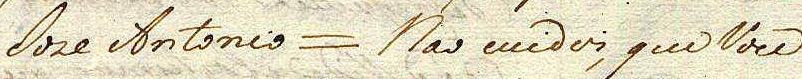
Ioze Antonio = Nao cuidei, que Voce
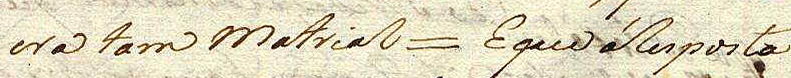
era tam Matrial = E que á Resposta
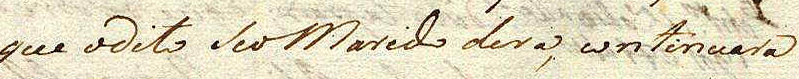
que o dito Seo Marido dera, continuara
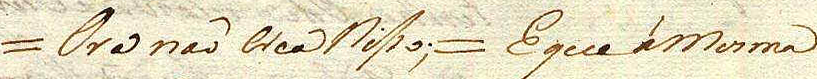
= Ora naõ crea Nisso; = E que á mesma
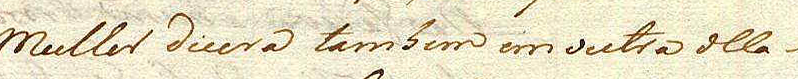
mulher dicera tambem em outra occa
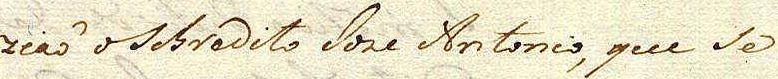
ziaõ o sobredito Ioze Antonio, que se
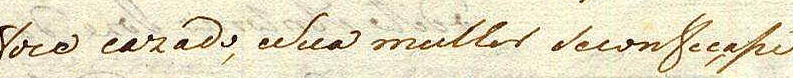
foce cazado, e sua mulher se confeçasse
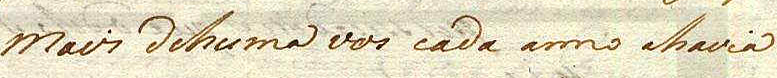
mais de huma ves cada anno a havia
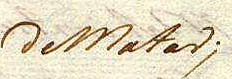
de Matar;
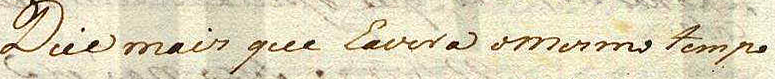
Dice mais que havera o mesmo tempo
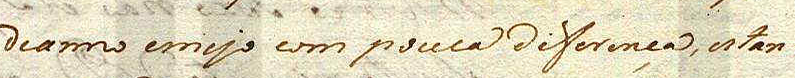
de anno e mejo com pouca diferença, estan
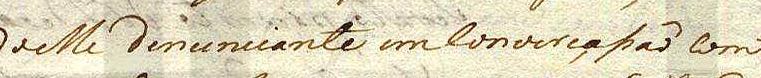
do elle denunciante em Converçassaõ com
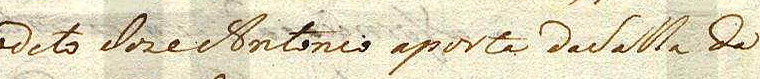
o dito Ioze Antonio a porta da Salla da
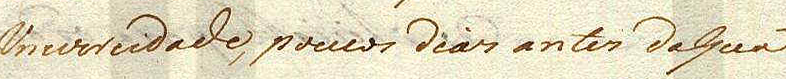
Univercidade, poucos dias antes da Qua
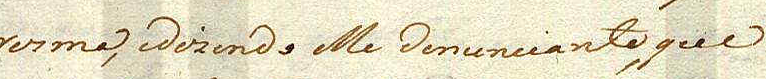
resma, e dizendo elle denunciante, que
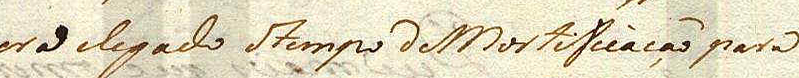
era chegado o tempo de Mortificaçaõ para
